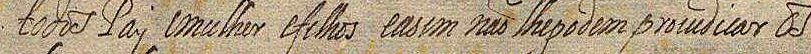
todos Pay e mulher e filhos e asim não lhe podem proiudicar os
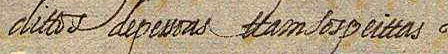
dittos de pessoas ttam sospeittas
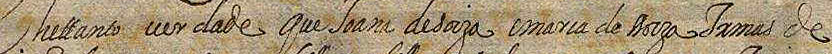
E he ttanto uerdade que Ioana de soiza e maria de ssoiza Irmas de
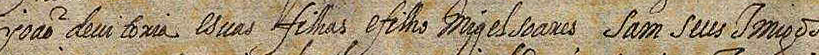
Yoaõ de uitoria e suas filhas e filho migel soares sam seus Imigos
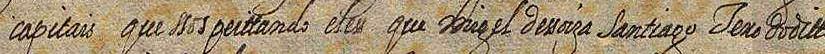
capitais que ssospeittando eless que migel de ssoiza Santiago Iero do ditto
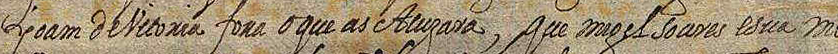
Yoam de Vitoria fora o que as Acuzara, que migel soares e sua mo
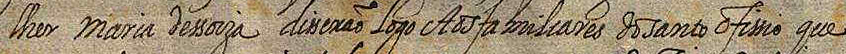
lher maria de ssoiza disseraõ Logo Aos familiares do santo ofissio que
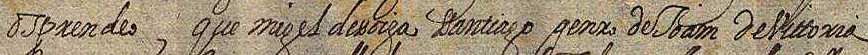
os prendeo, que migel de ssoiza ssantiago genro de Ioam de Vittoria
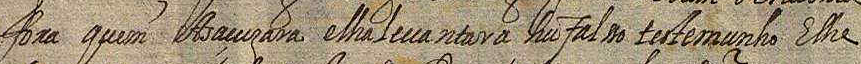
fora quem As açuzara e lhaleuantara hū falsso testemunho E lhe
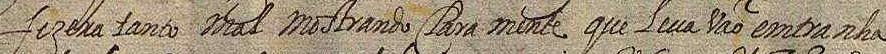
fezera tanto mal mostrando Claramente que LeuaVaõ emtanha
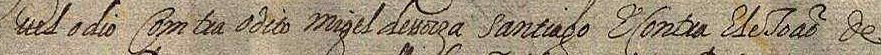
uel odio Comtra o dito migel de ssoiza santiago E Contra Ele Ioão de
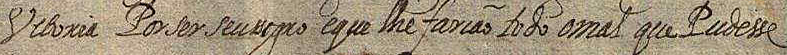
Vitoria Por ser seu ssogro e que lhe fariaõ todo o mal que Pudesse
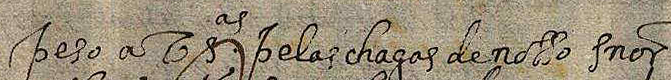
Peso a V Sas. pelas chagas de nosso snor̄
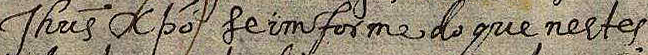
Jhus̄ Xpō se imforme do que nestes
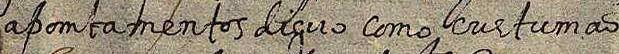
apomtamentos diguo como custumaõ
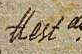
ttestas.
